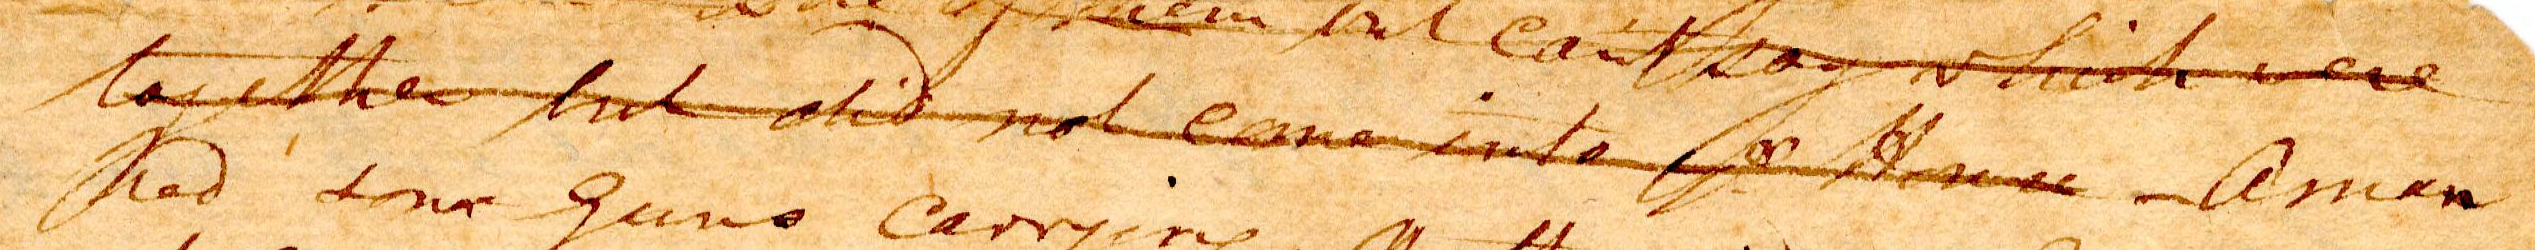together but did not come into our House -A man
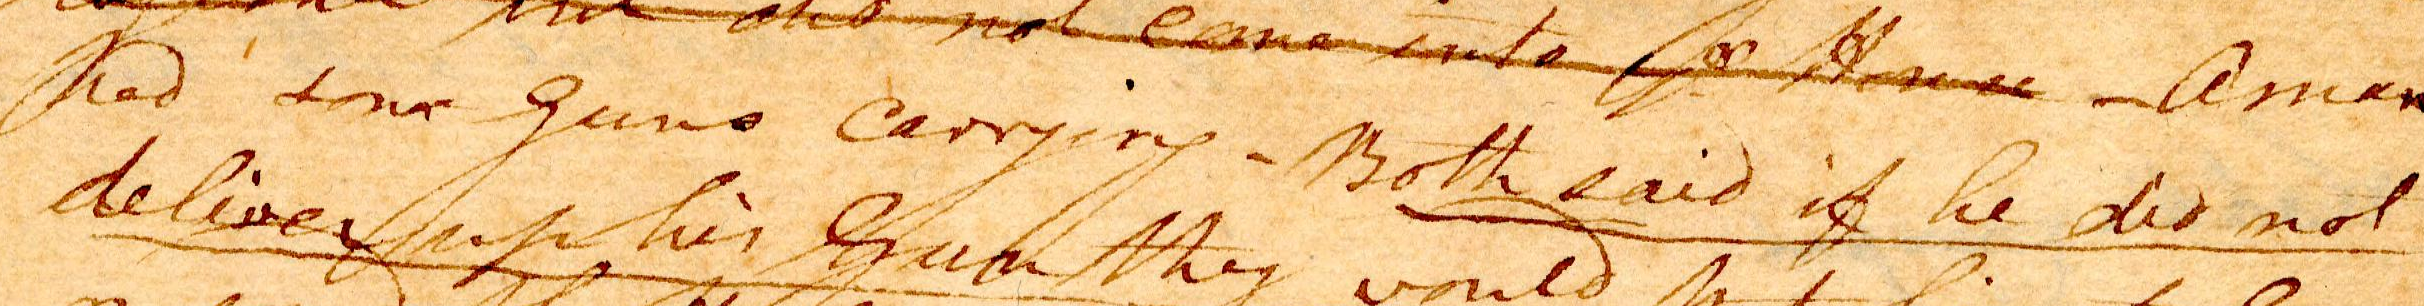had two guns carrying- Both said if he did not
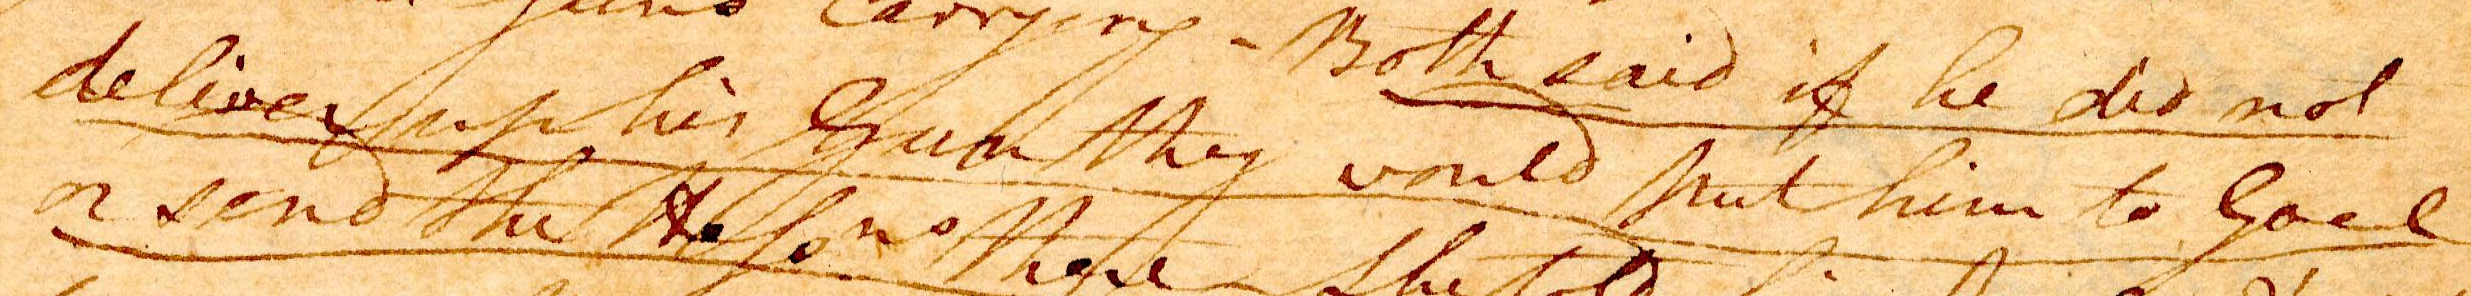deliver up his Gun they would put him to Gael
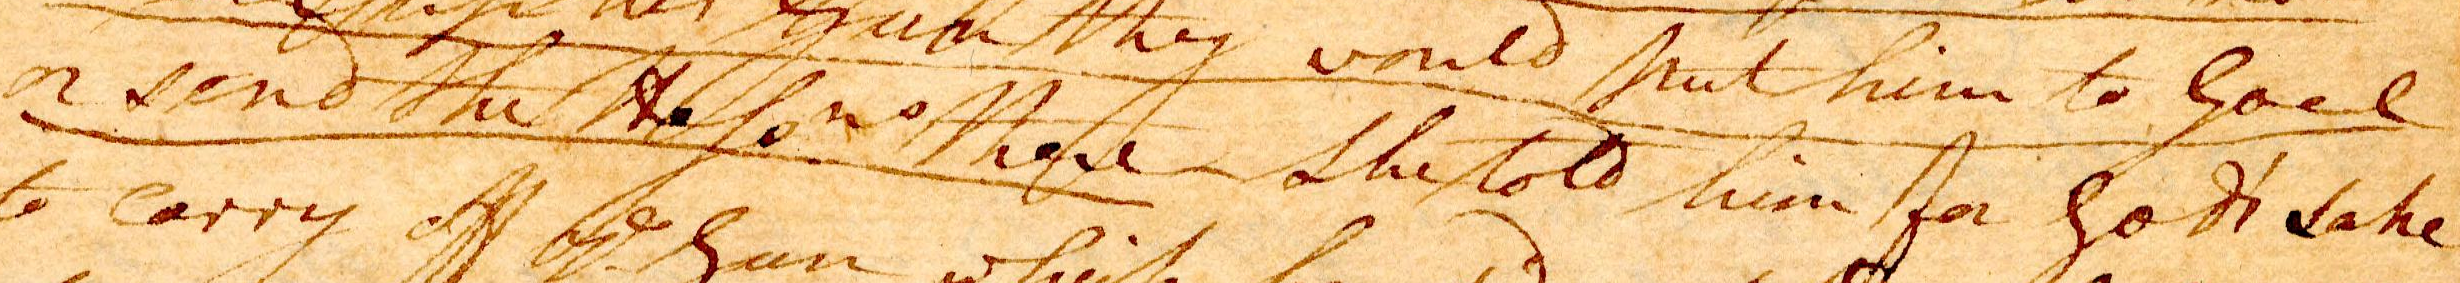or send the Hess^ns there- She told him for go & take
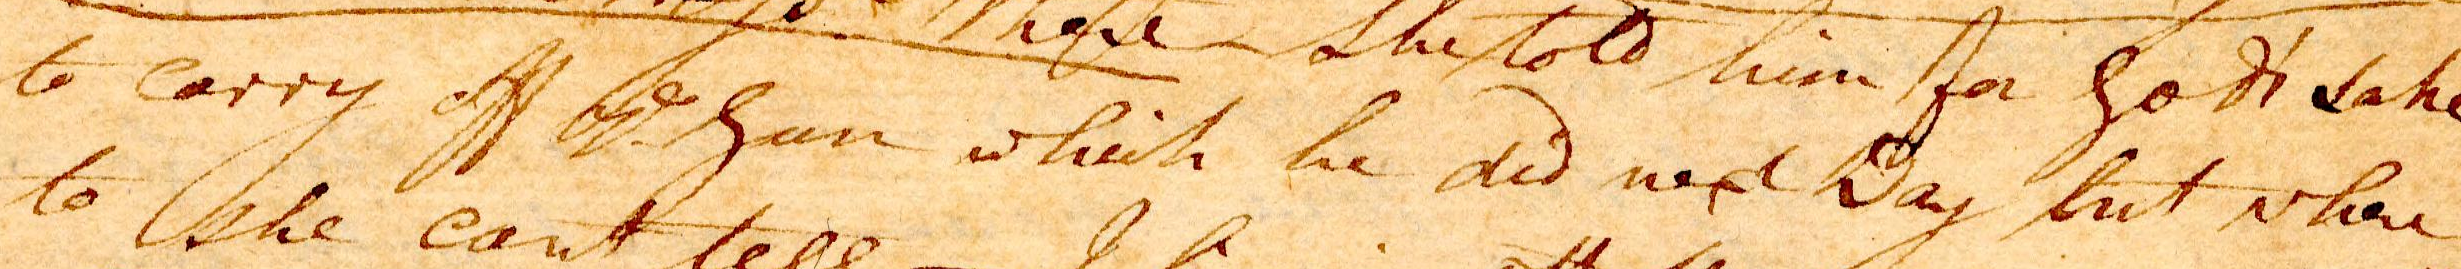to carry off one gun which he did next Day but where
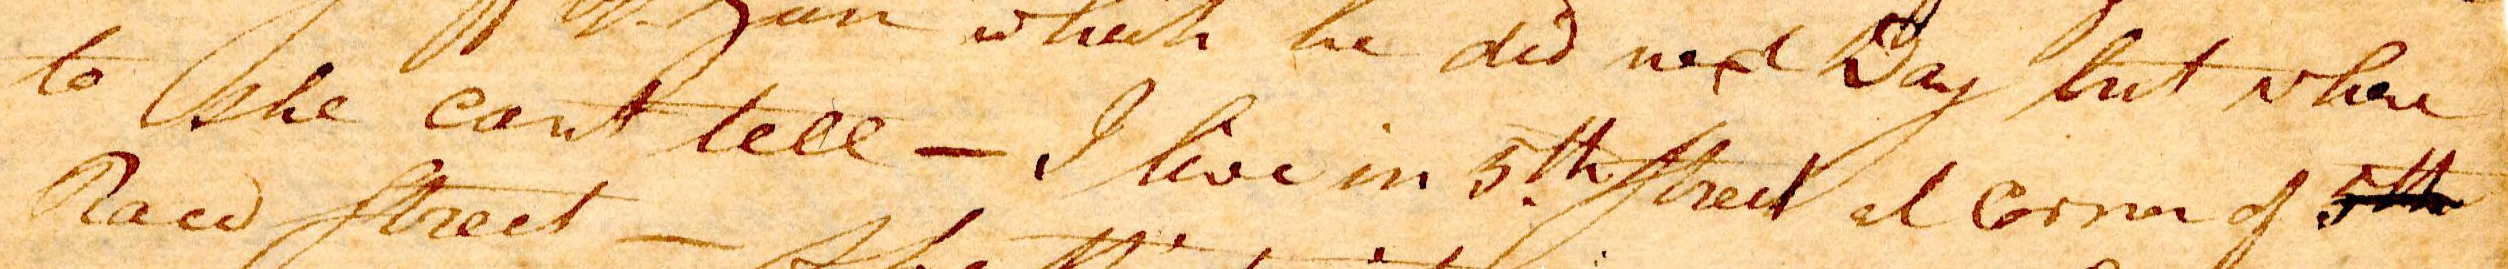to she can't tell- I live in 5th Street at corner of [5^th]
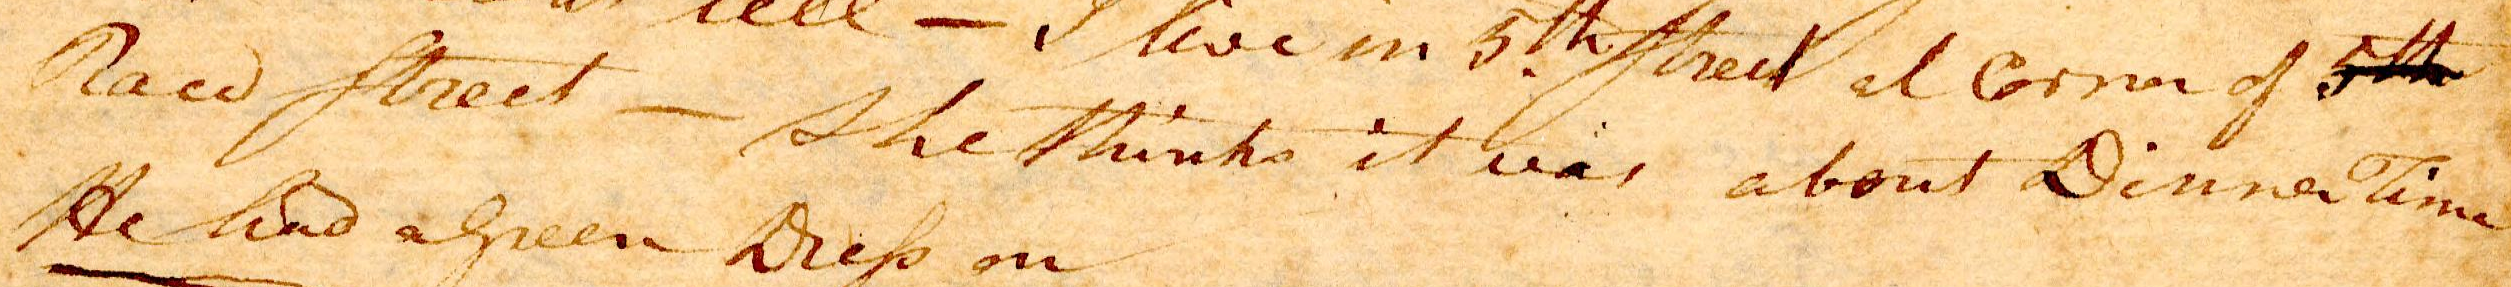Race street- She thinks it was about Dinner Time
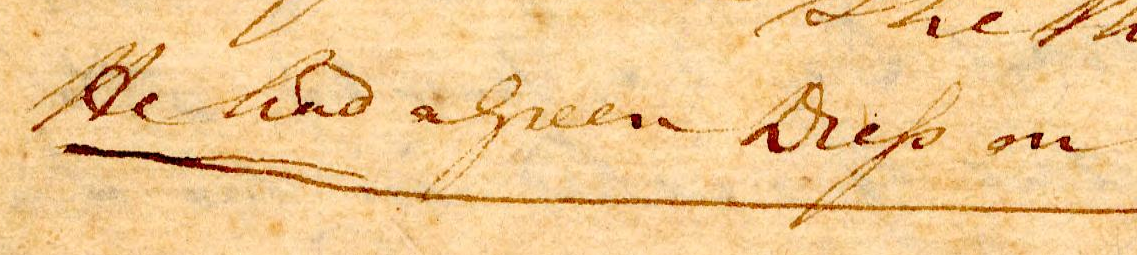He had a green Dress on
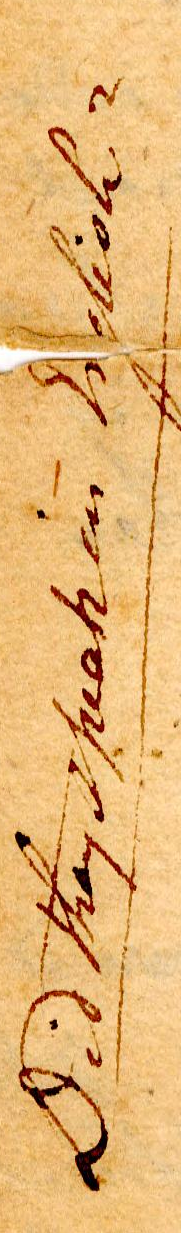Did they speak in English?
